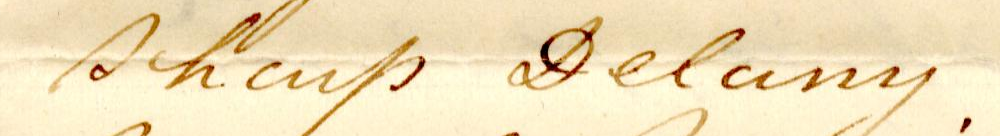Sharp Delany
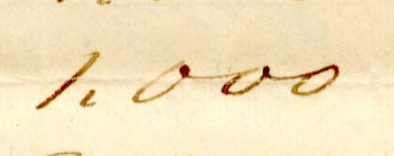1,000
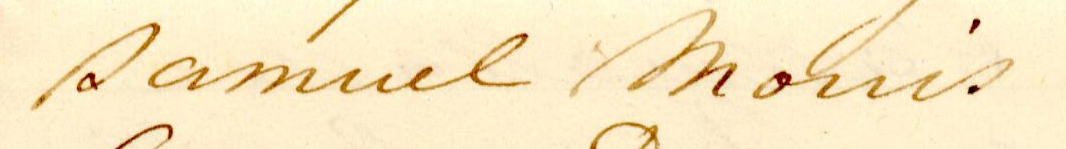Samuel Morris
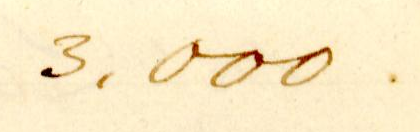3,000
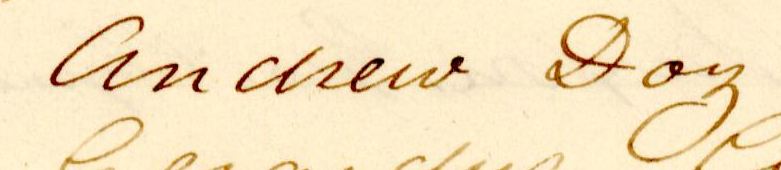Andrew Day
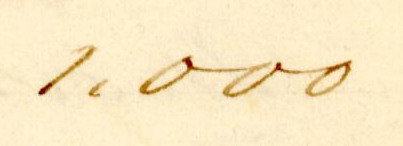1,000
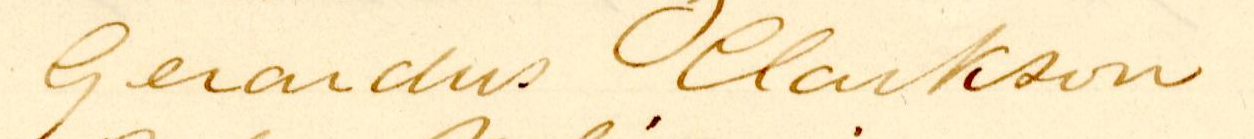Gerardus Clarkson
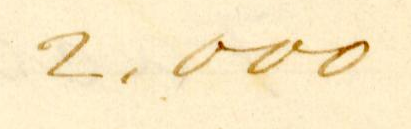2,000
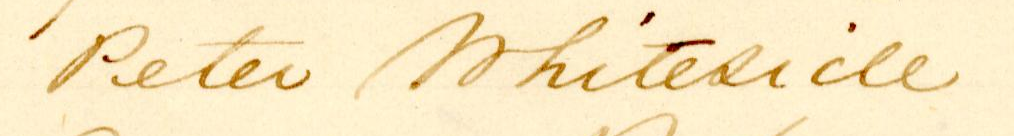Peter Whiteside
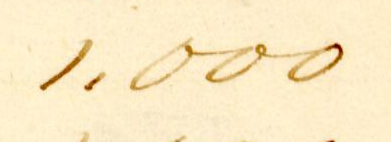1,000
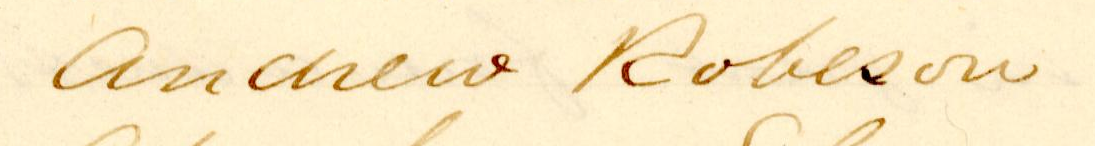Andrew Robeson
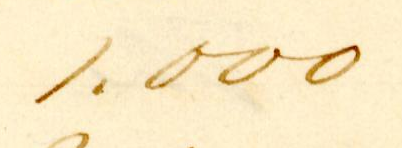1,000
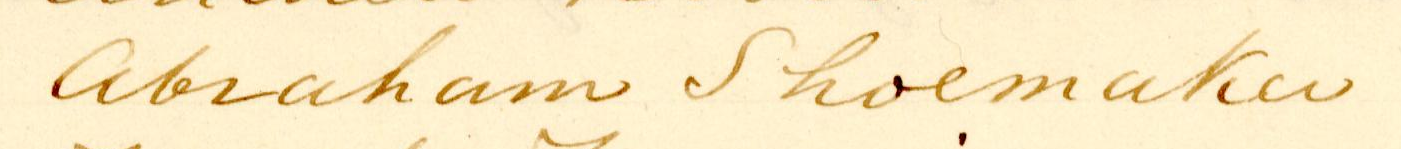Abraham Shoemaker
